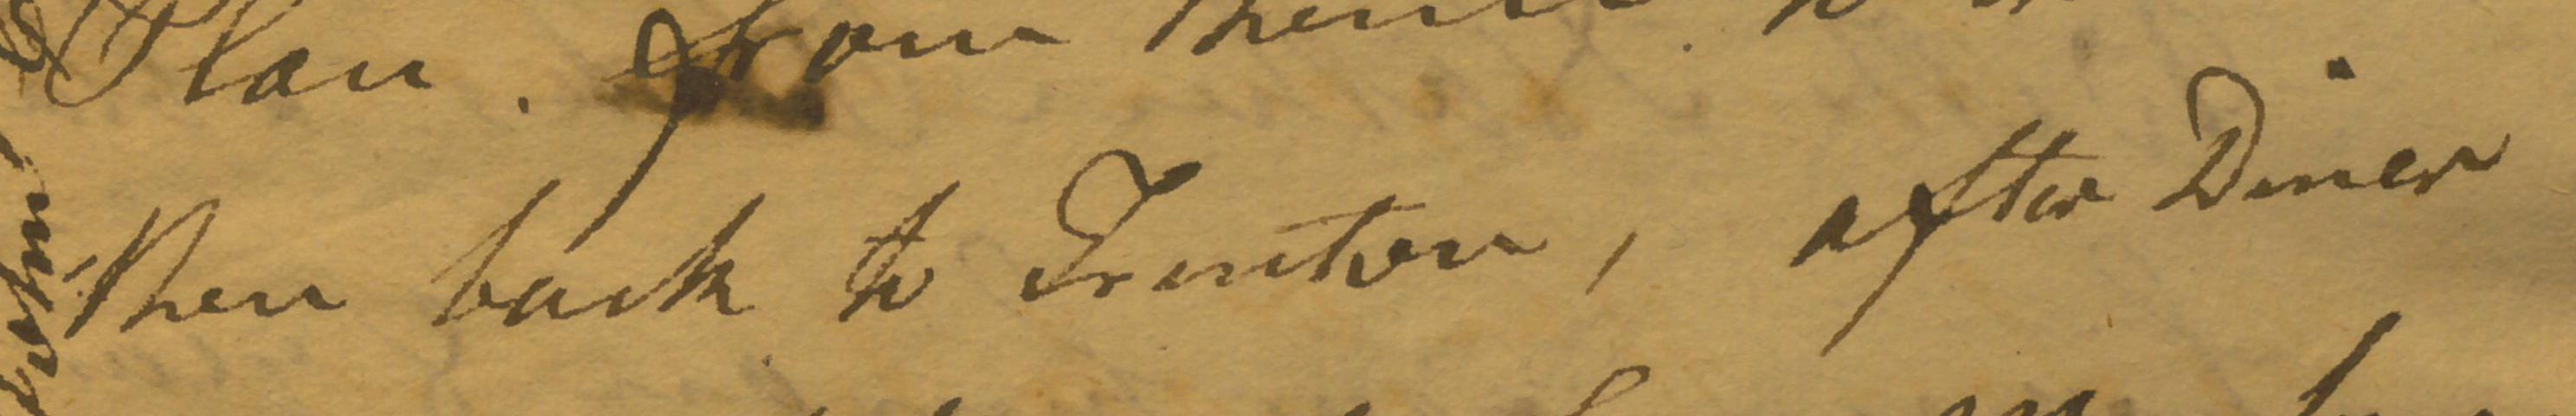then back to Trenton, after Diner
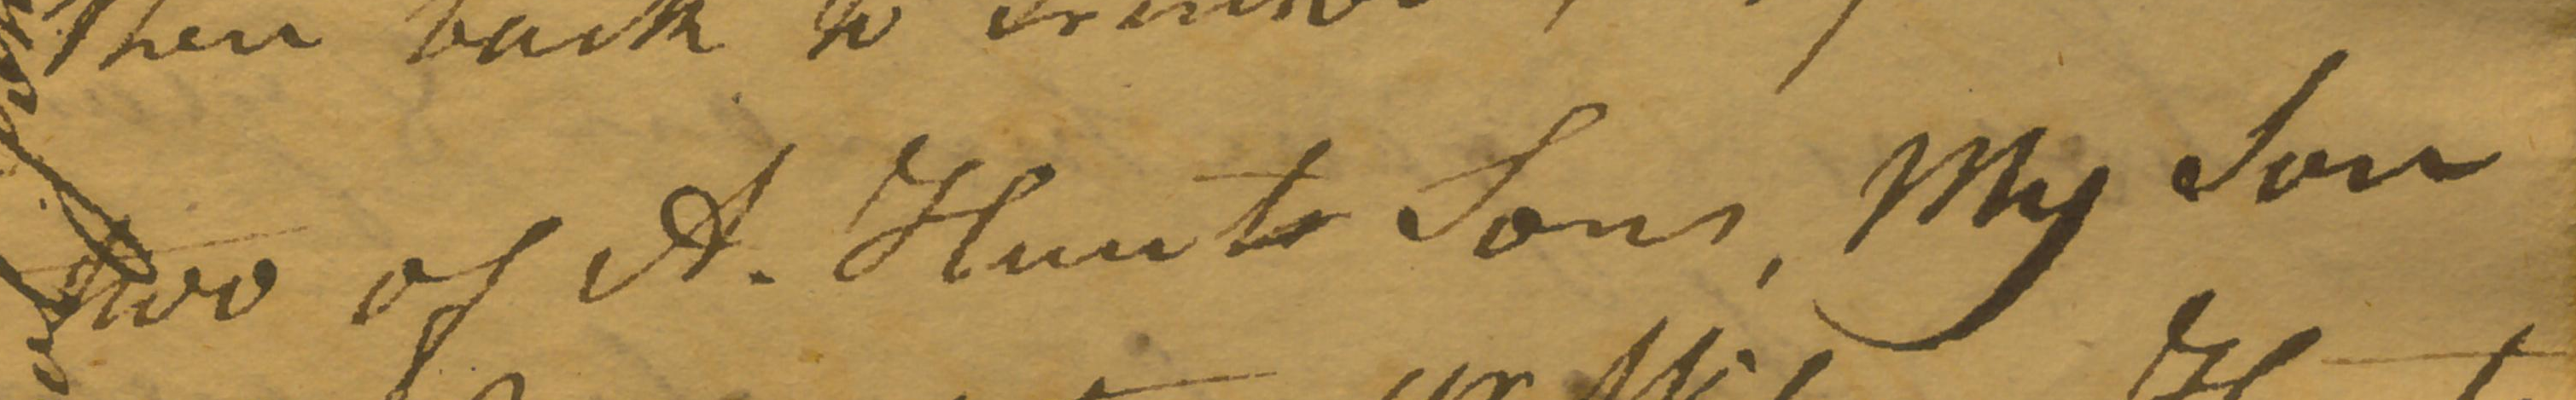two of A. Hunts sons My Son
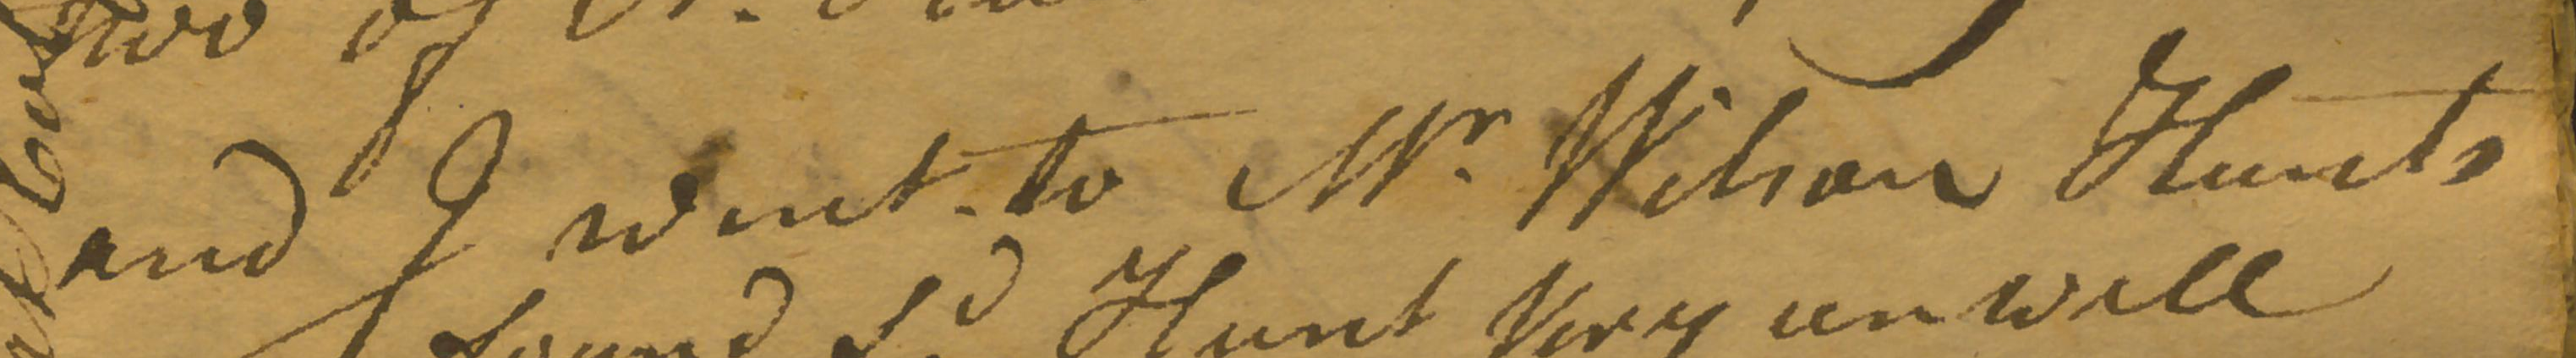and I went to M^r. Wilson Hunts
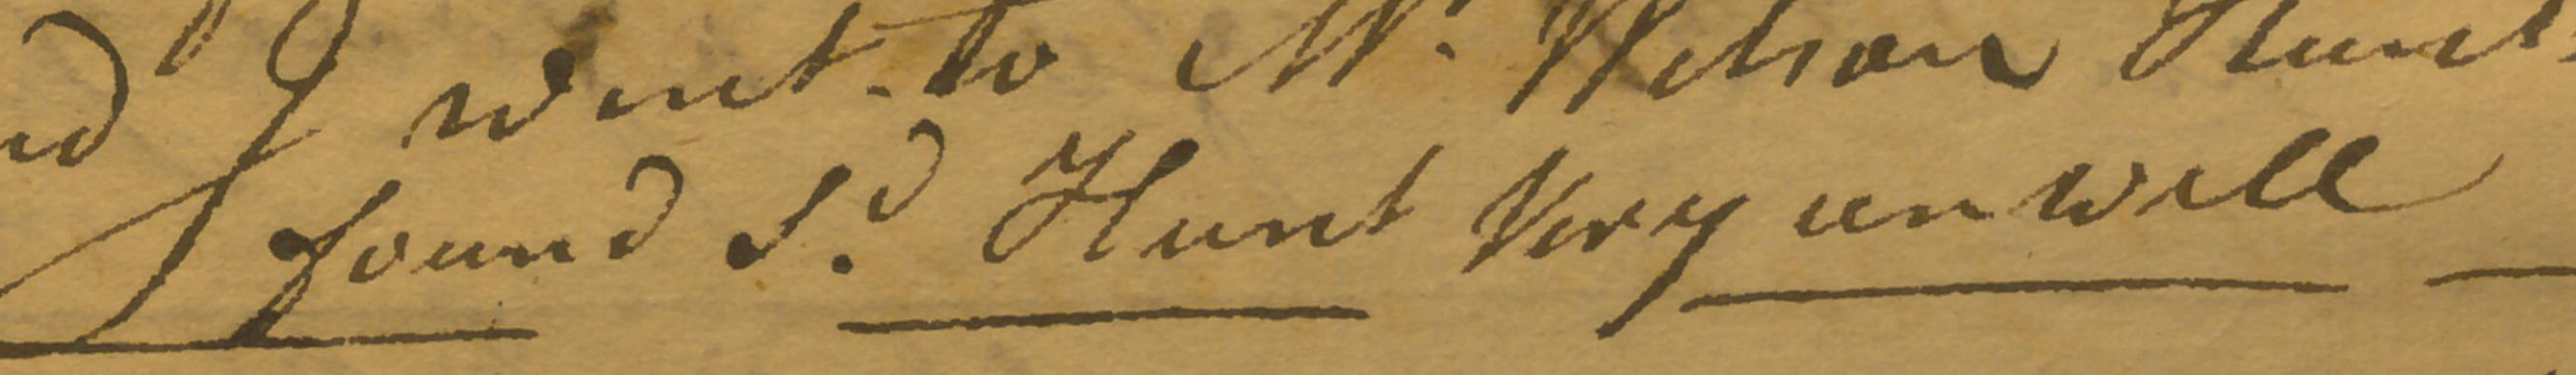found s^d. Hunt Very unwell
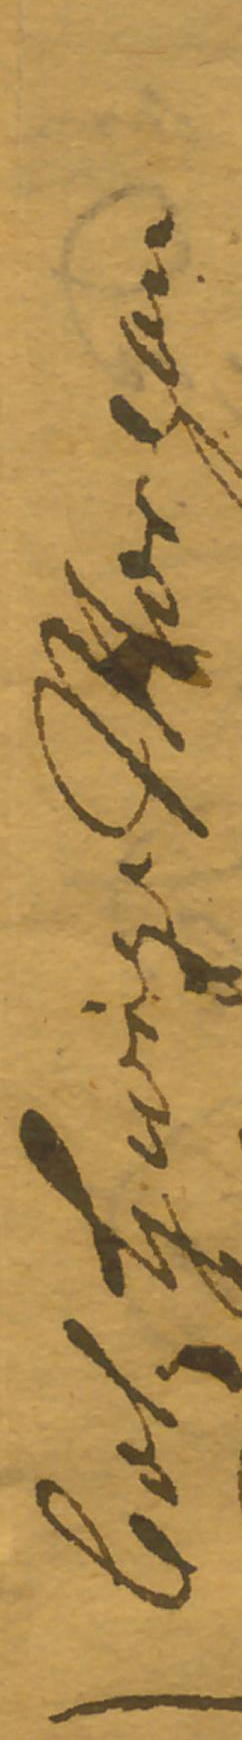Col. George Morgan
